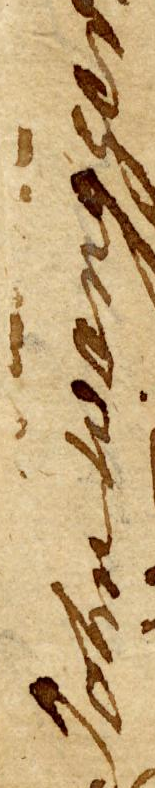John wanggers
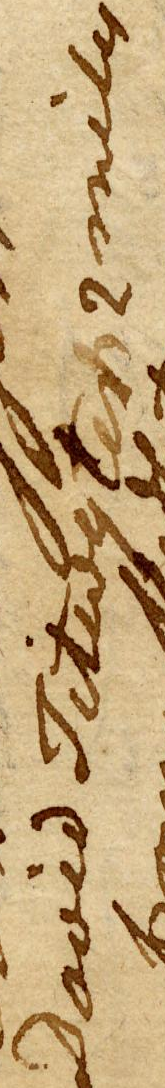David Titwyters 2 mills
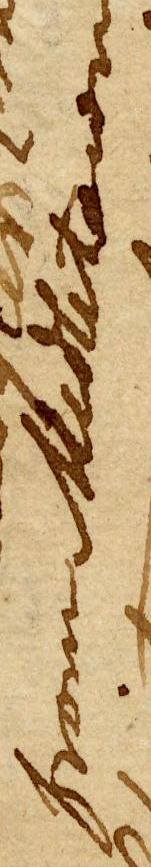from Midletown
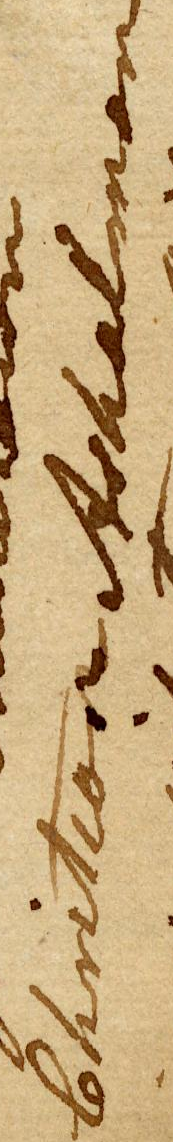Chritan Ashalman
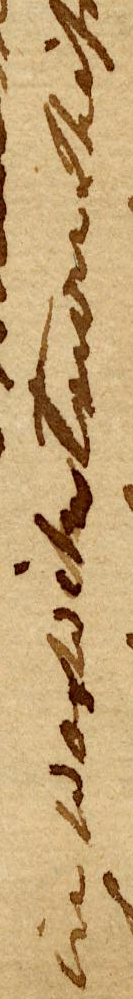in Warwicktown Shift
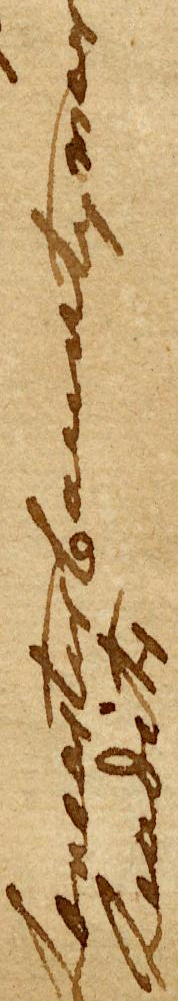Lancaster County near
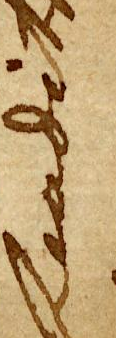Landit
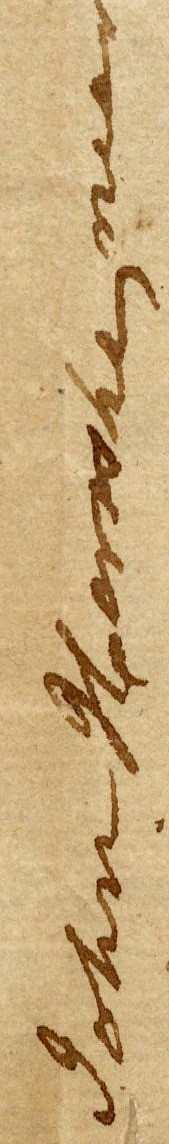John Harshe near
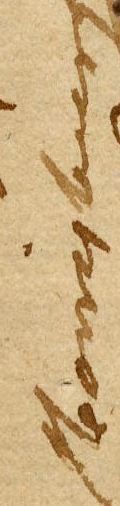Konisburg
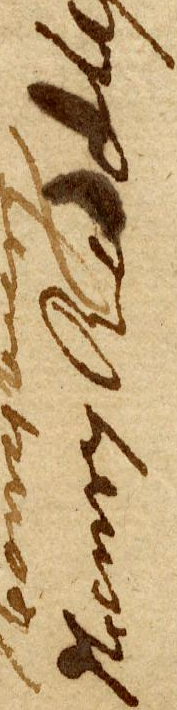Henry Reddly
